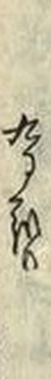九月朔日
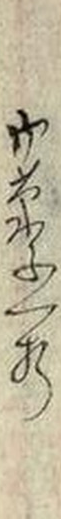御菓子一折
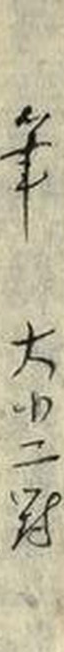筆大小二対
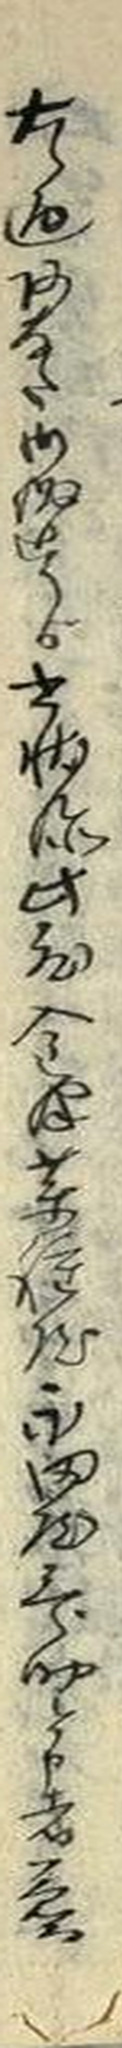右之通あなた御側廻りゟ書状添此度金津菜種屋永田屋三郎助と申者兼而
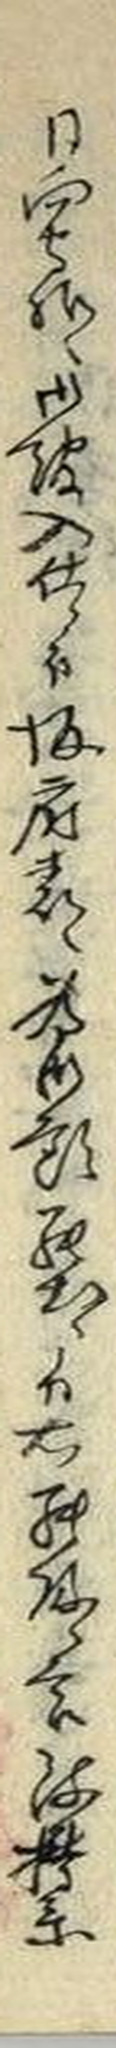日向守様へ御館入仕候ニ付坂府表へ為御歓罷出候ニ付右罷帰候節致持参

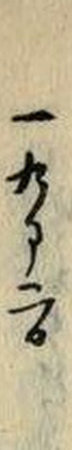一九月二日
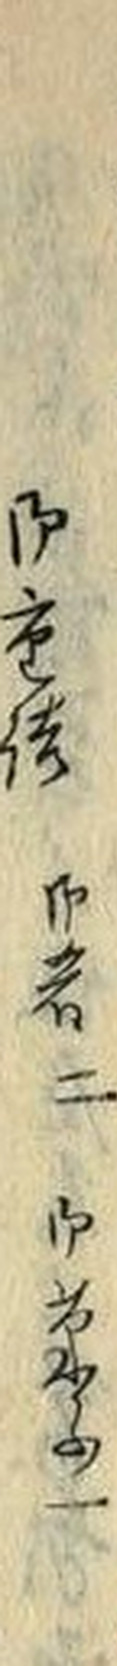御重詰御肴二御菓子一
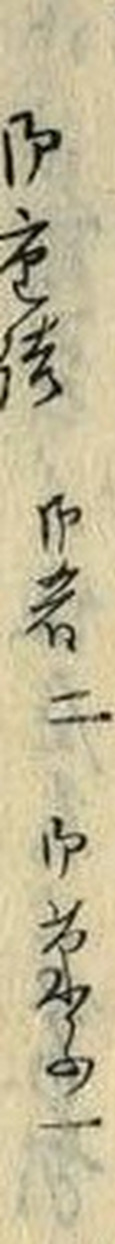御重詰御肴二御菓子一
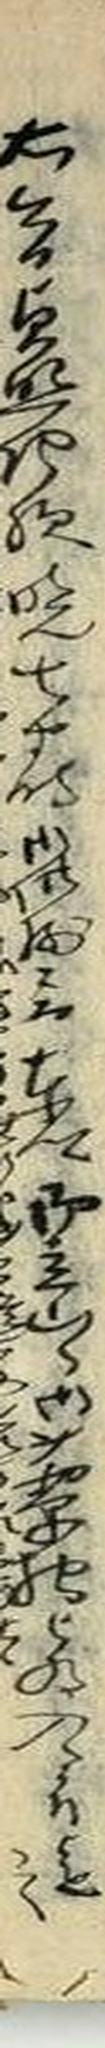右今日貞照院様暁七半時御供揃ニ而東郷御立山へ御蕈狩被為入御候ニ付被進之
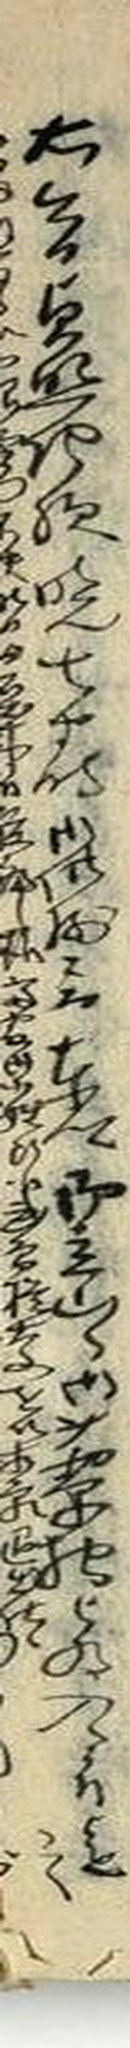右今日貞照院様暁七半時御供揃ニ而東郷御立山へ御蕈狩被為入御候ニ付被進之
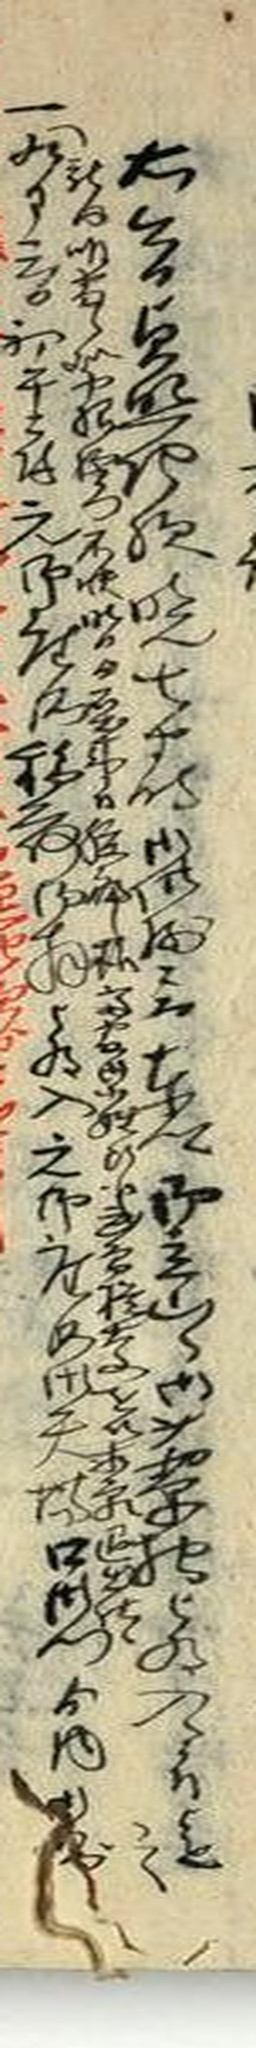九月三日初午ニ付元御座所稲荷御拝被為入元御座所御矢場口御門ゟ内御側
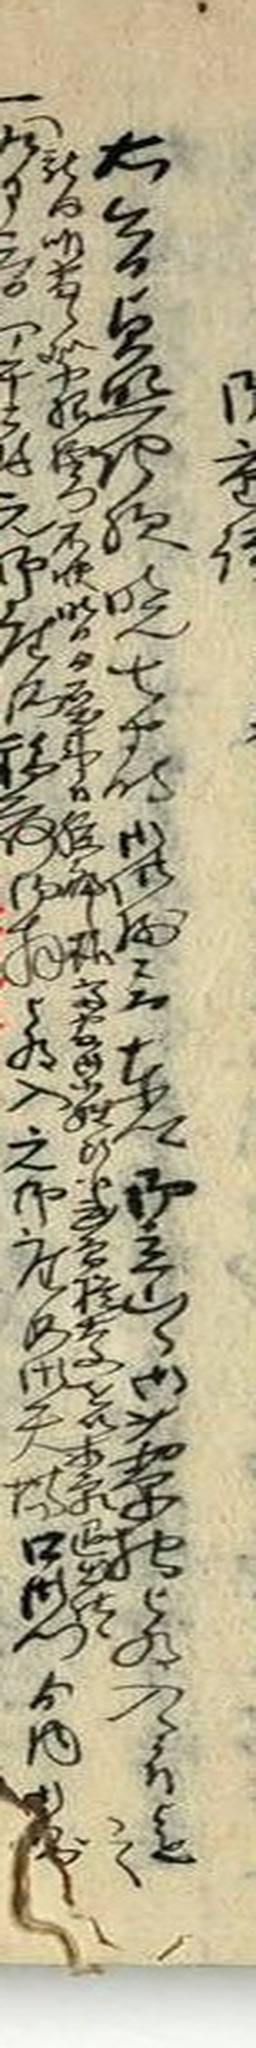九月三日初午ニ付元御座所稲荷御拝被為入元御座所御矢場口御門ゟ内御側
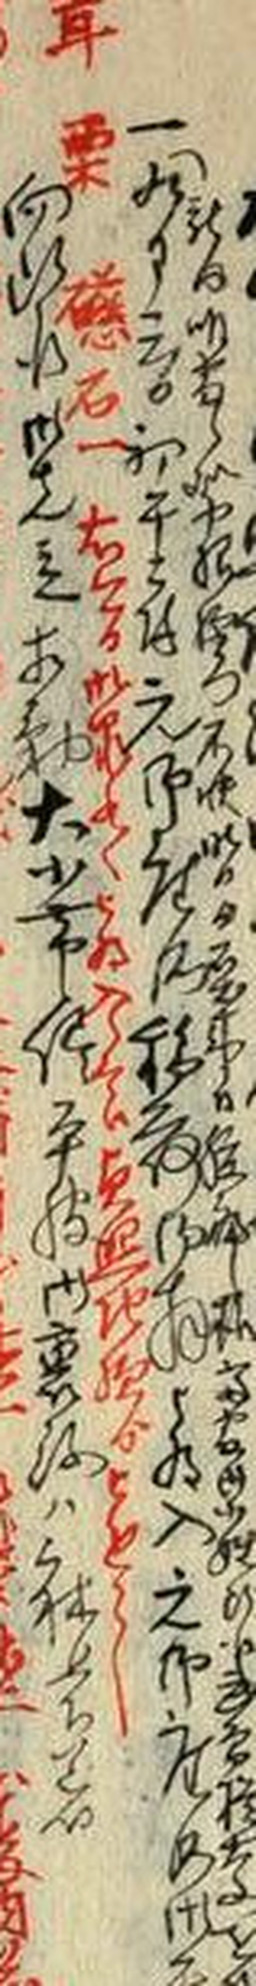向頭取御先立相勤大小帯儘平服御裏役ハ麻上下着
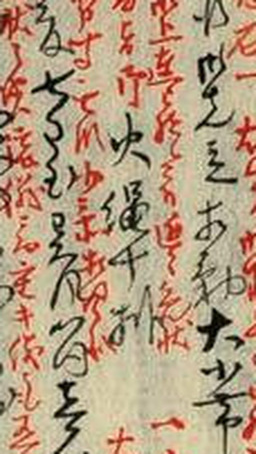火縄十掛
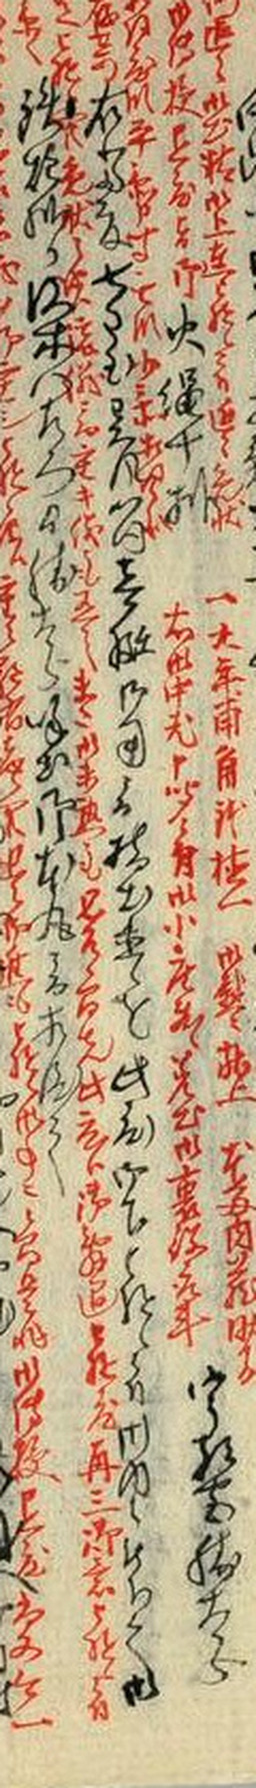右当夏七匁玉異風筒壱挺御用ニ而指出置候を此度御下被遊候ニ付御内々被下之御
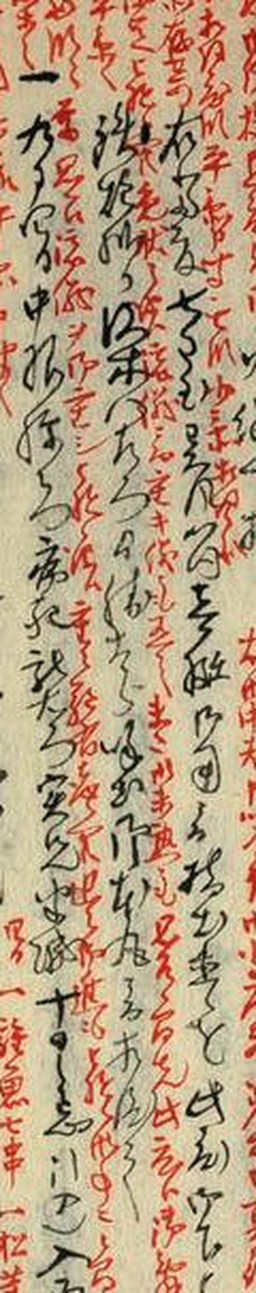鉄炮掛り沢木八左衛門ゟ勝太郎呼出御本丸ニ而相渡之
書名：少傅日録抄（斉承付側向頭取日記、在国）
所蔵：福井県文書館 Fukui Prefectural Archives
